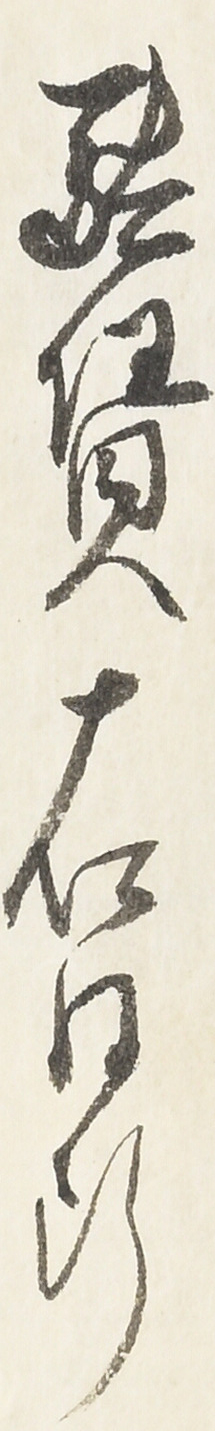駄賃右同断
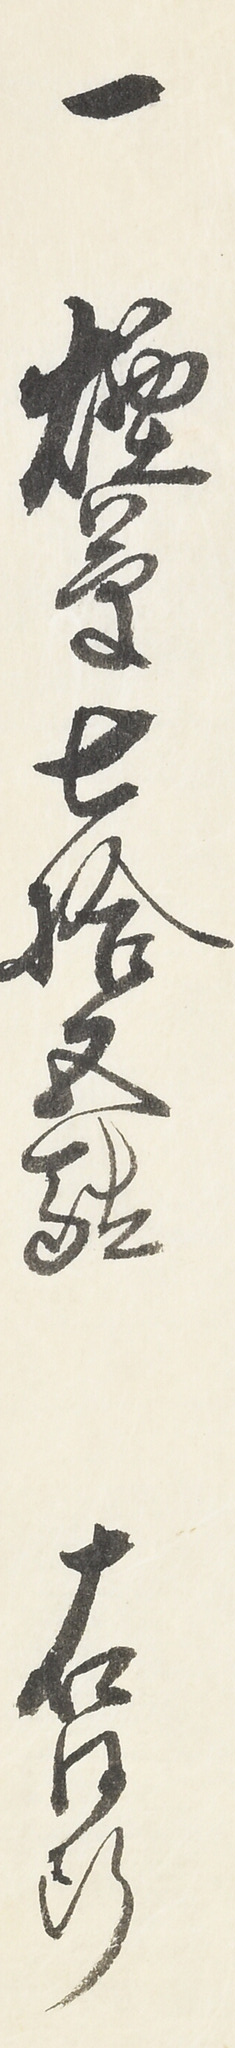一煙草七拾五駄右同断
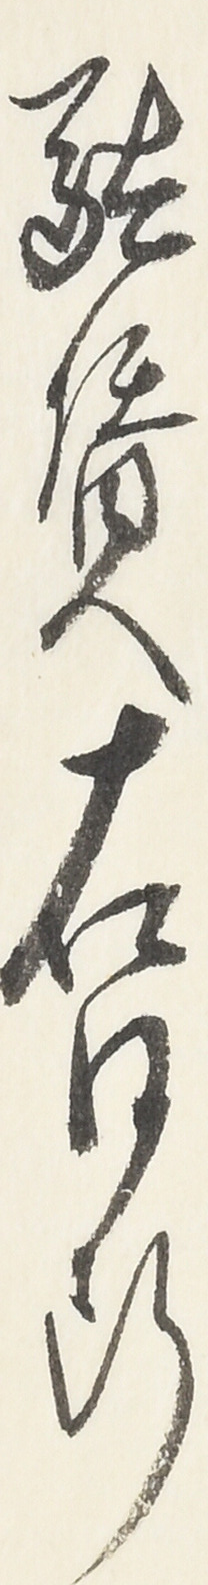駄賃右同断

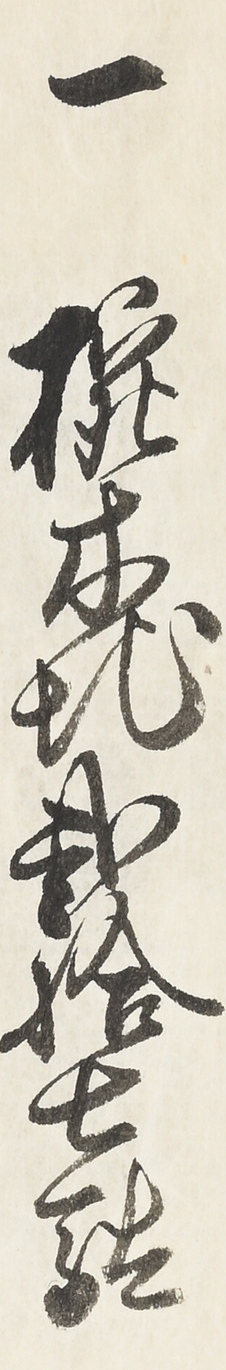一腕木地弐拾七駄但
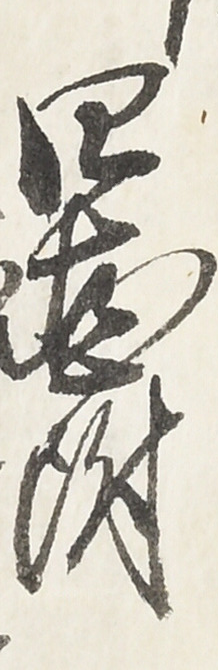四固附
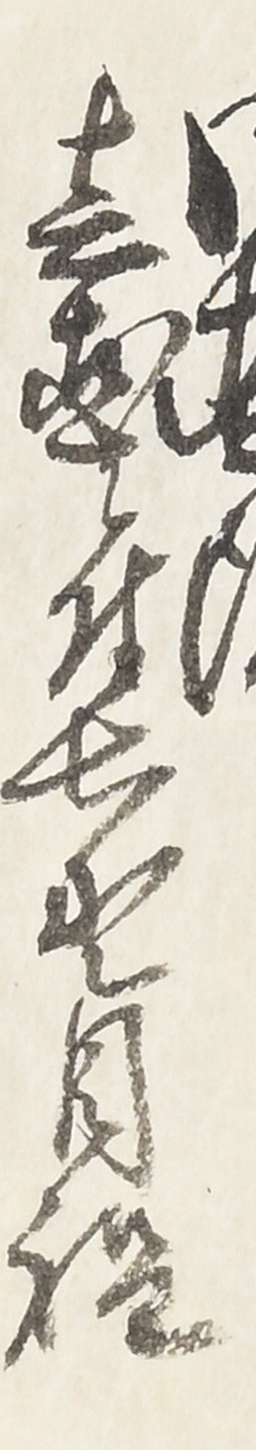壱固ニ付七貫目程
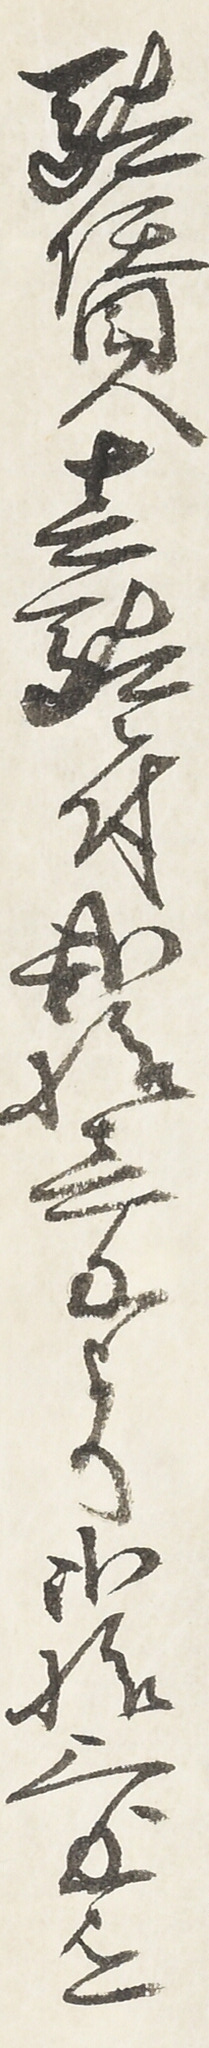駄賃壱駄ニ付弐拾壱匁より弐拾三匁迄
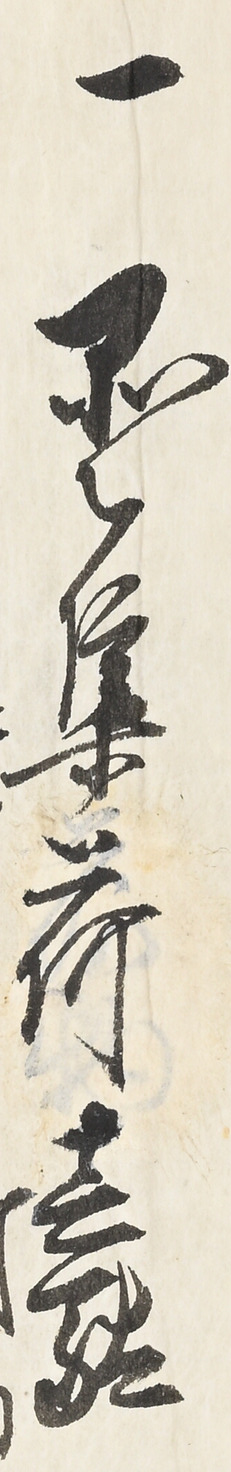一品々集荷壱駄
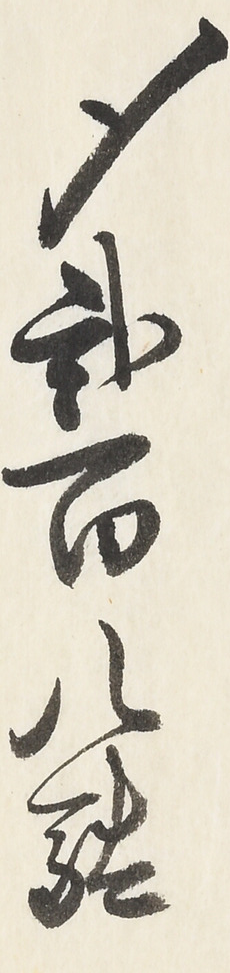〆弐百八駄
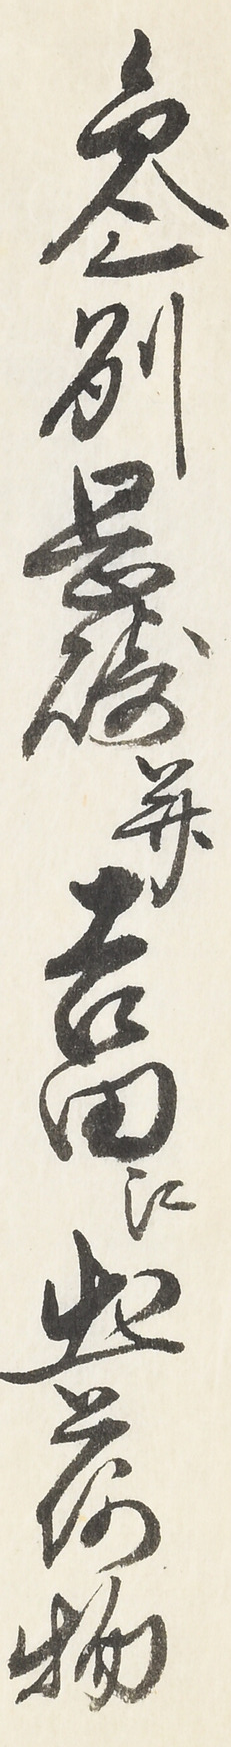参州岡崎并吉田江出荷物
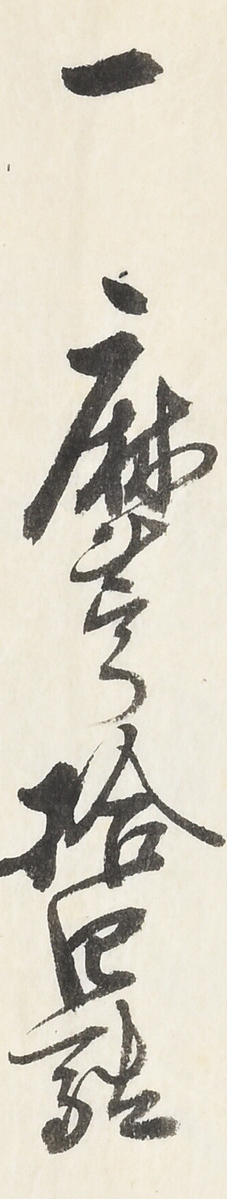一麻苧拾四駄但
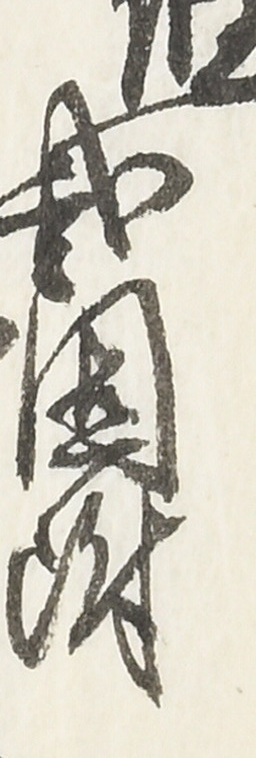弐固附
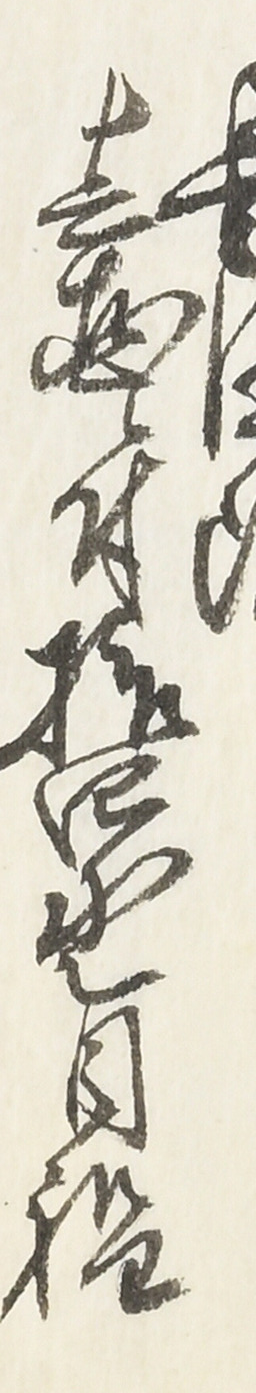壱固ニ付拾四貫目程
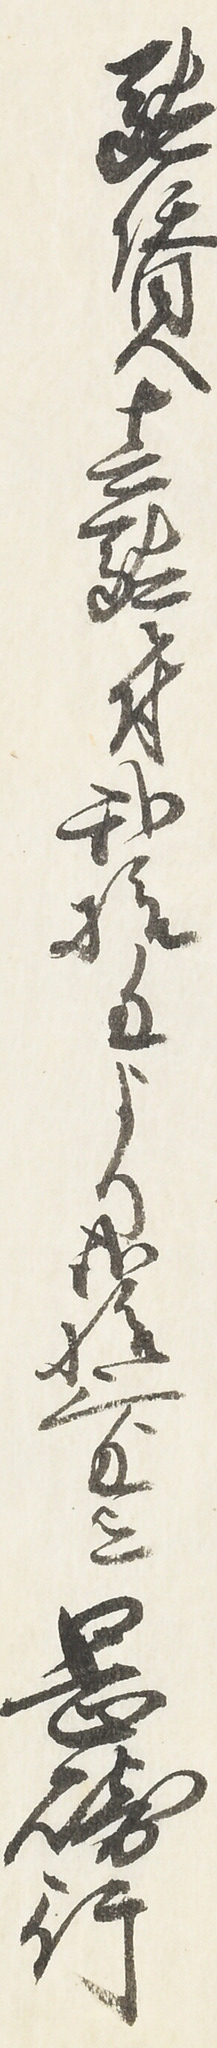駄賃壱駄ニ付弐拾匁より弐拾三匁迄
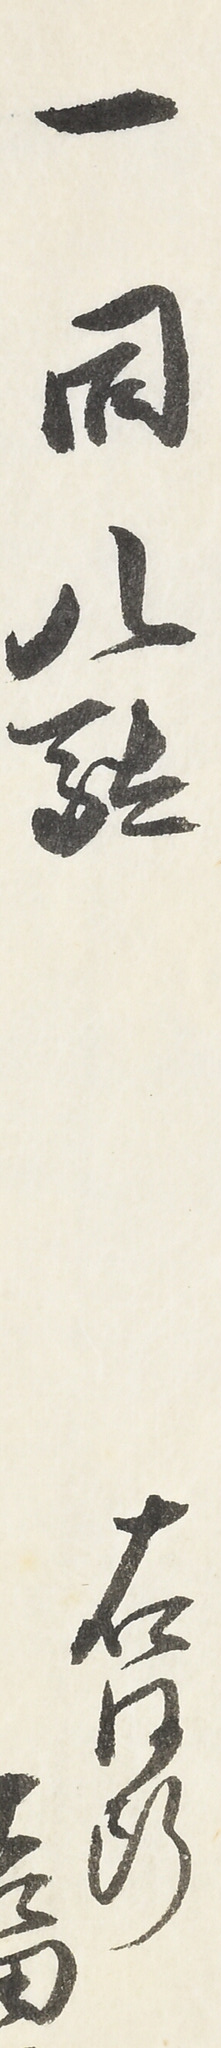一同八駄右同断
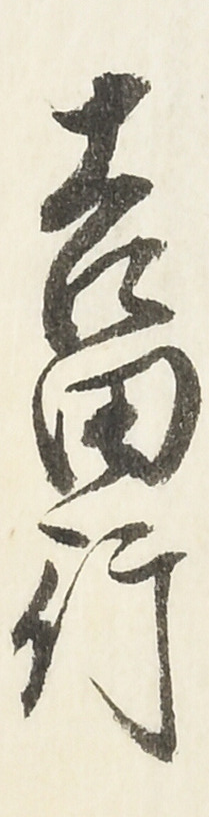吉田行
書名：中馬ニテ附通候出入荷物目録帳
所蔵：伊那市立高遠町図書館・合同会社AMANE
